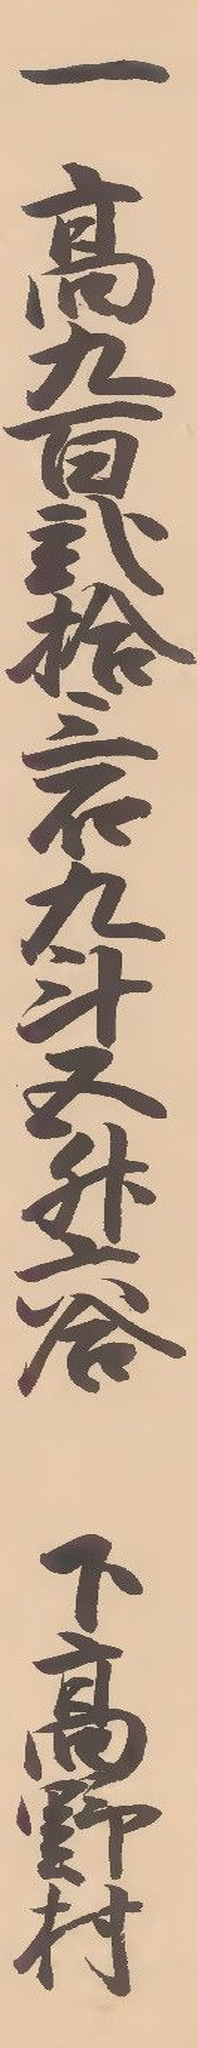一高九百弐拾三石九斗五升六合下高野村
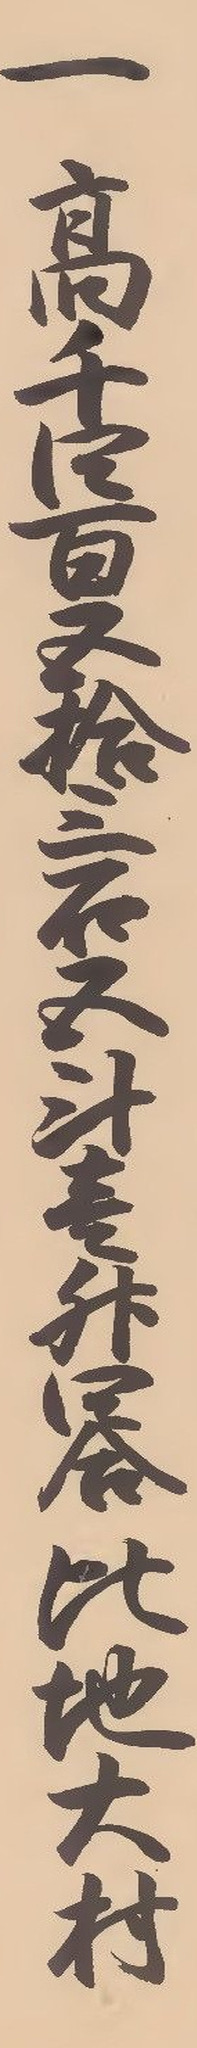一高千四百五拾三石五斗壱升四合比地大村
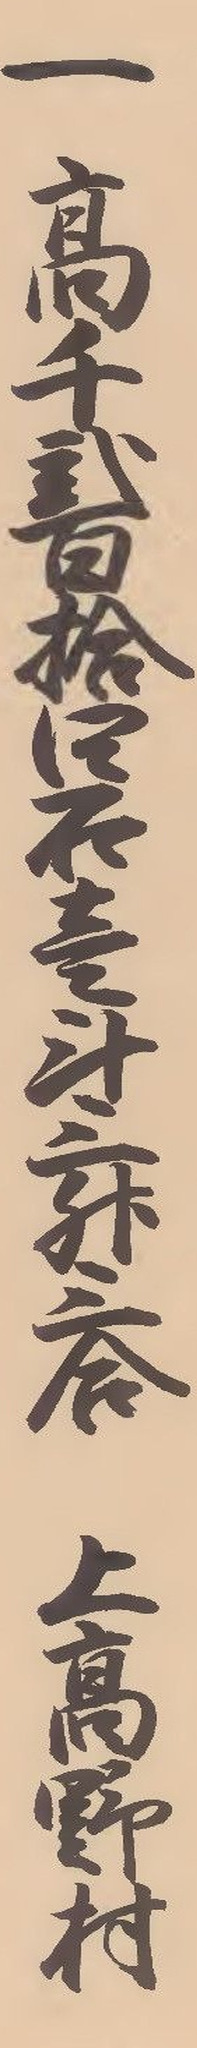一高千弐百拾四石壱斗三升三合上高野村
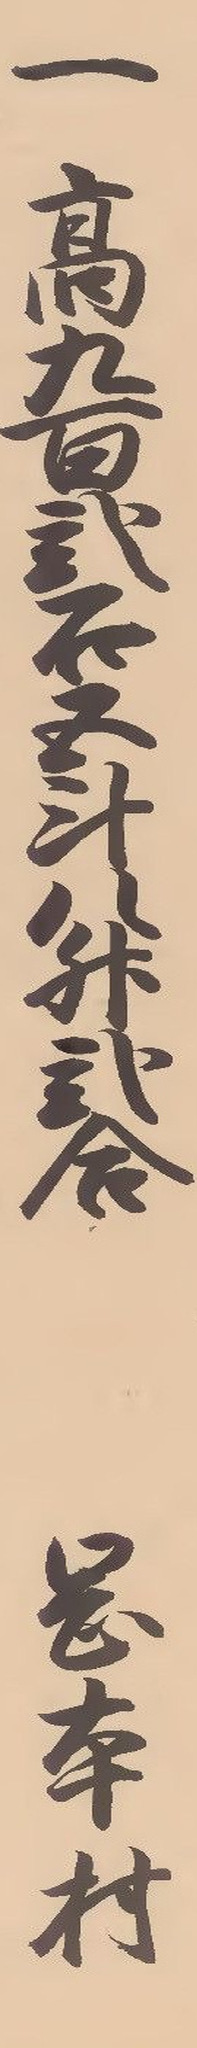一高九百弐石五斗八升弐合岡本村
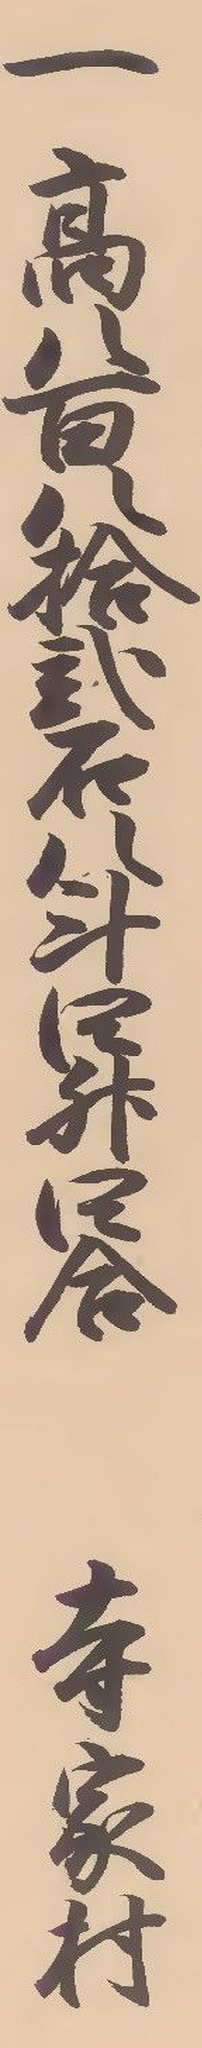一高八百八拾弐石八斗四升四合寺家村

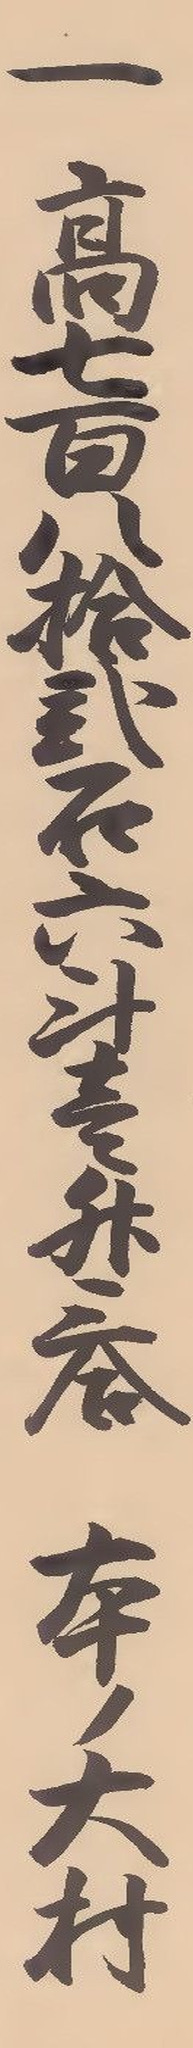一高七百八拾弐石六斗壱升三合本ノ大村
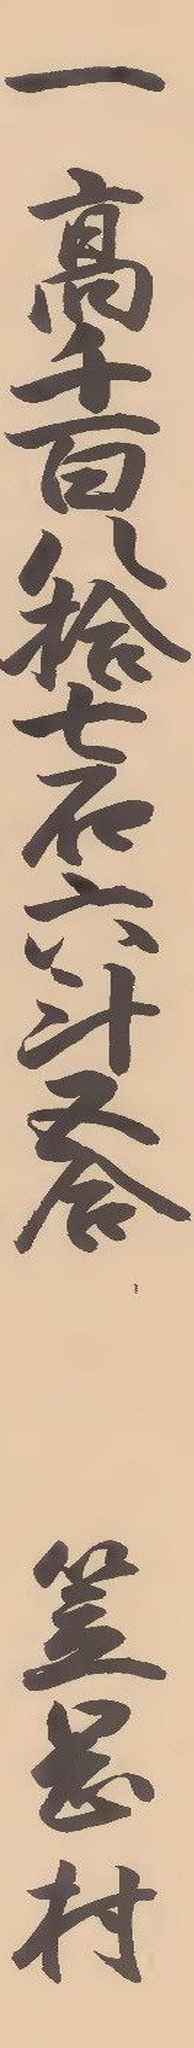一高千百八拾七石六斗五合笠岡村
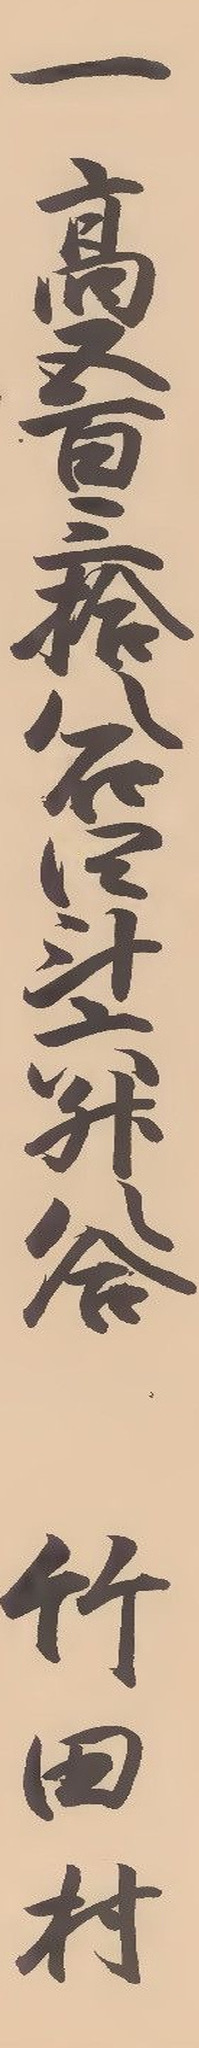一高五百三拾八石四斗六升八合竹田村
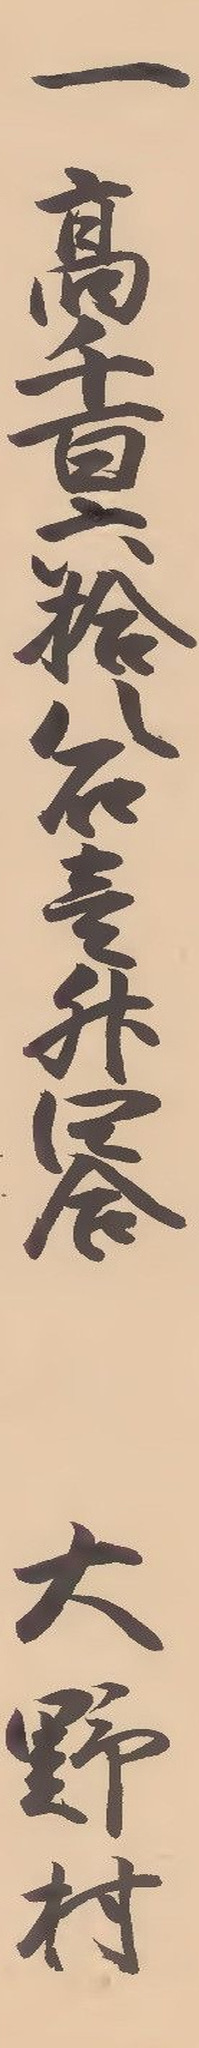一高千百六拾八石壱升四合大野村
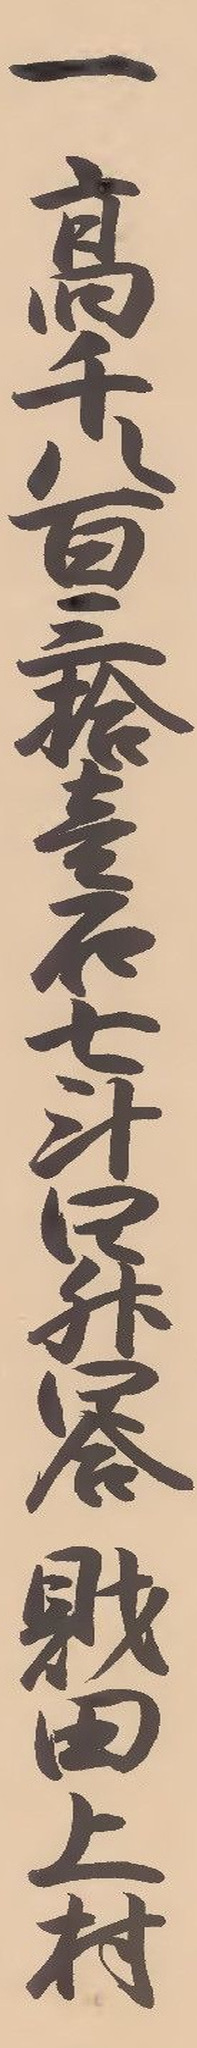一高千八百三拾壱石七斗四升四合財田上村
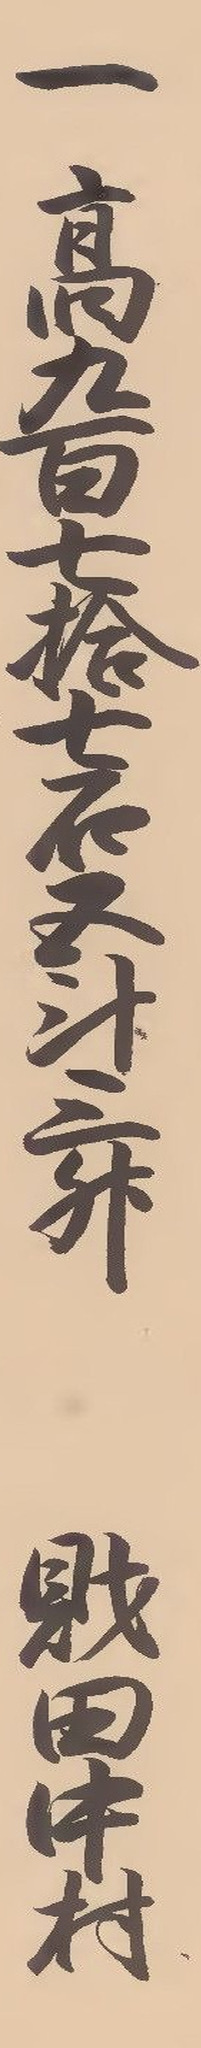一高九百七拾七石五斗三升財田中村
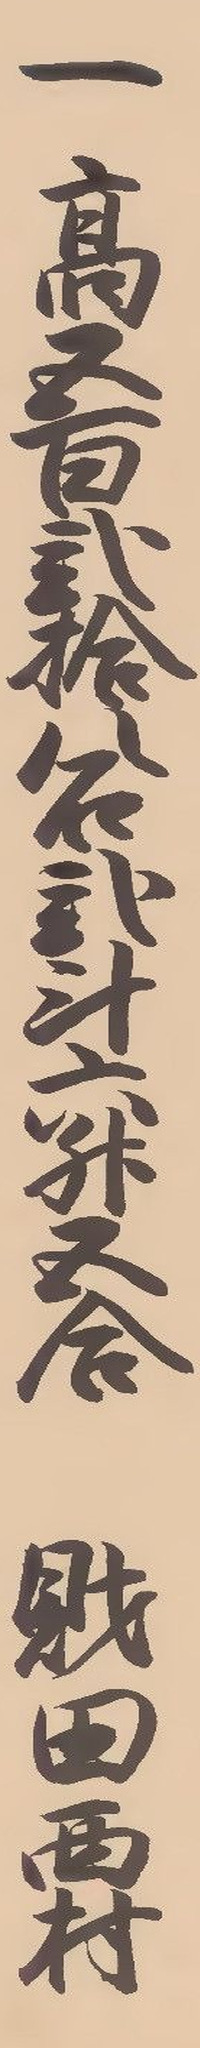一高五百弐拾八石弐斗六升五合財田西村
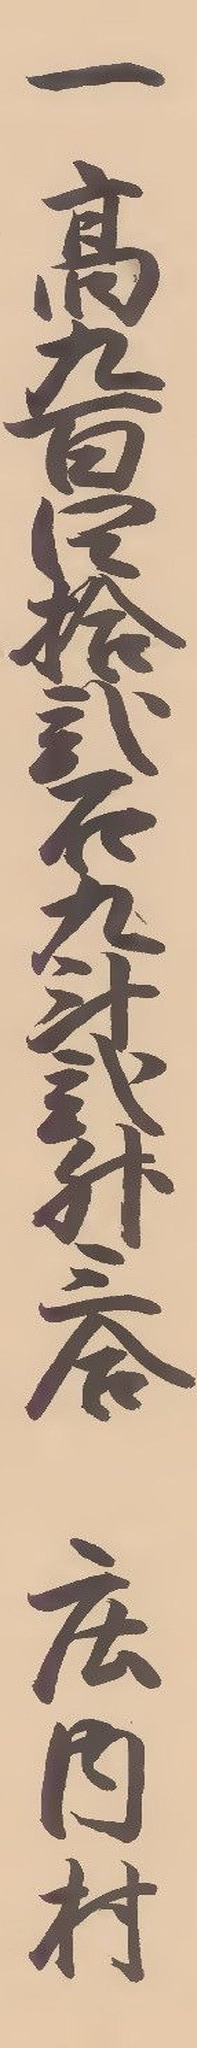一高九百四拾弐石九斗弐升三合庄内村

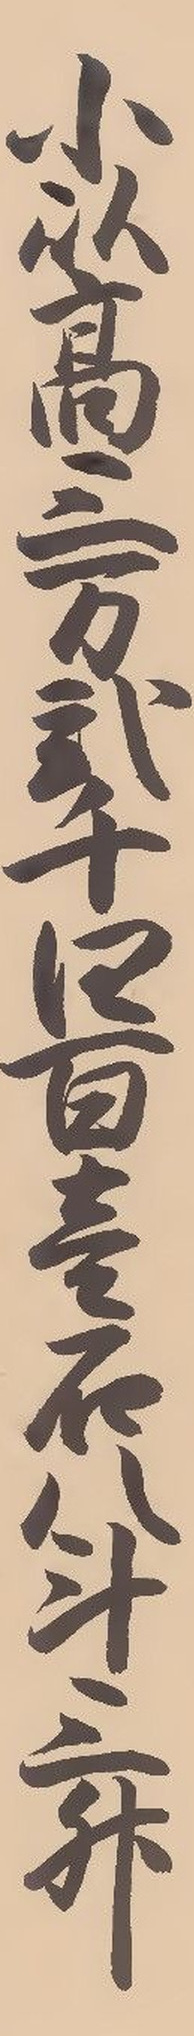小以高三万弐千四百壱石八斗三升
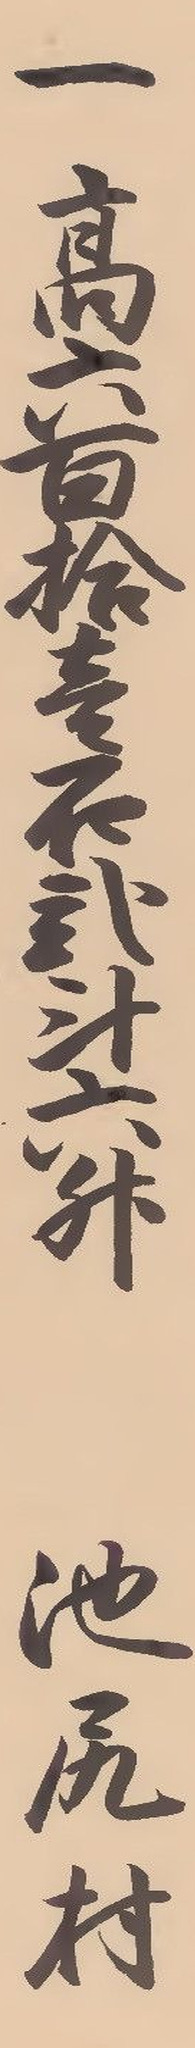一高六百拾壱石弐斗六升池尻村
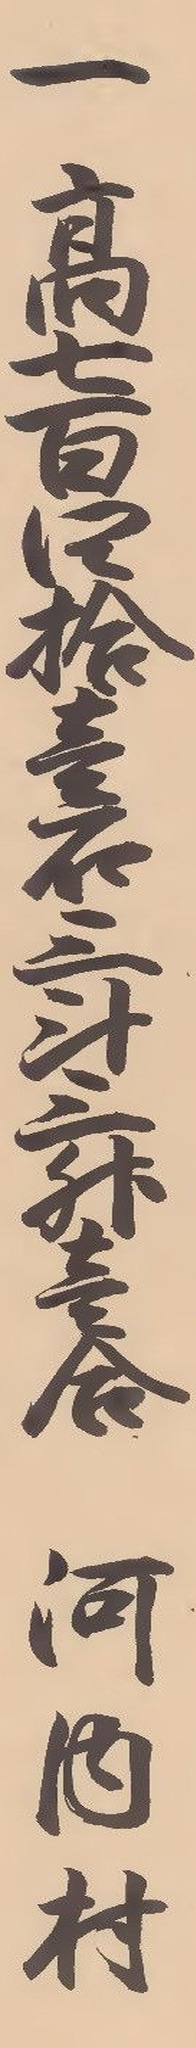一高七百四拾壱石三斗三升壱合河内村
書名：讃岐国郷帳
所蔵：国立公文書館 National Archives of Japan
